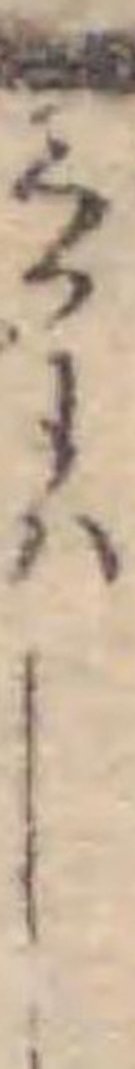くるには
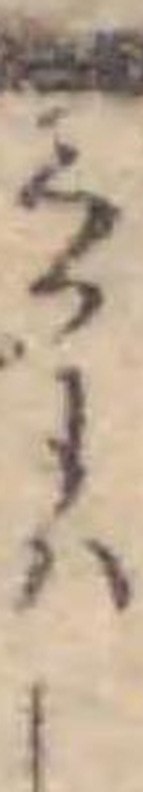くるには
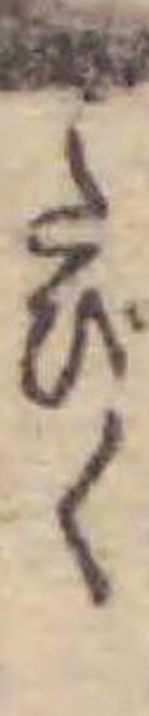たび〳〵
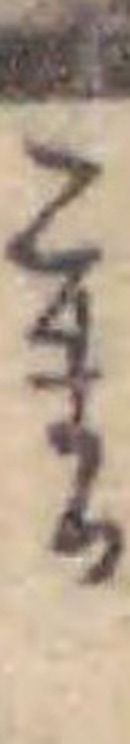こまる
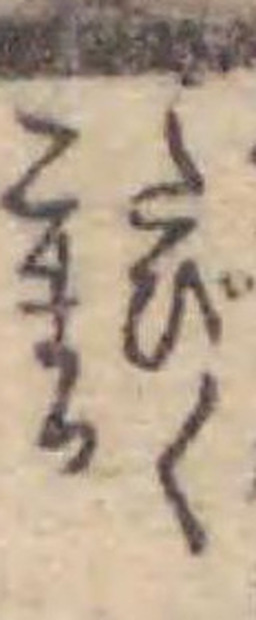こまる
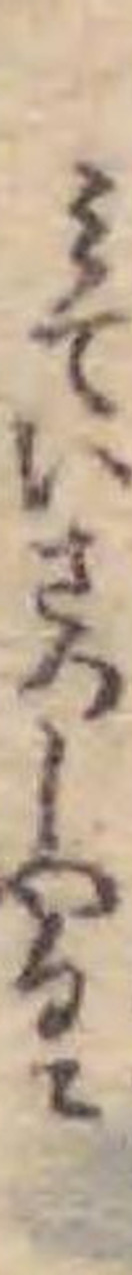みていさつしやるに
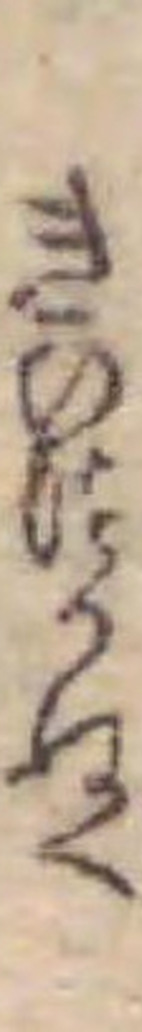きのつかねへ
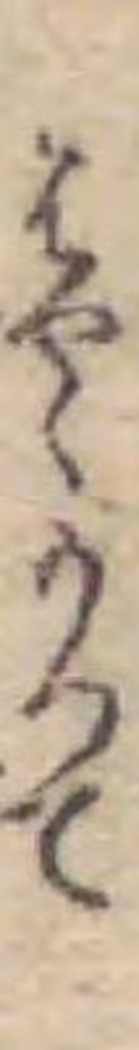はやくもつて
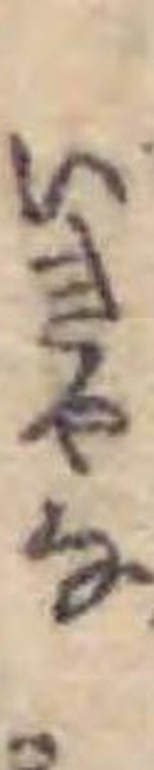いきやな
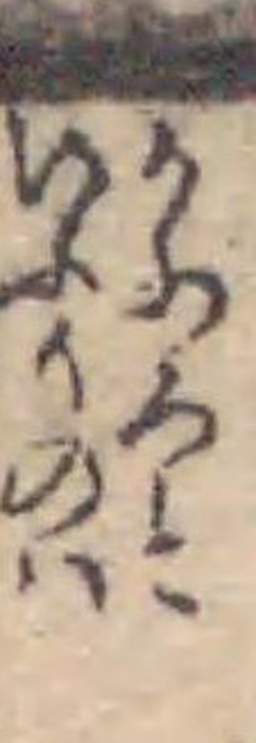いふものは
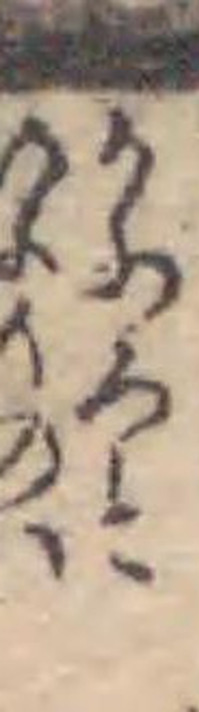いふものは
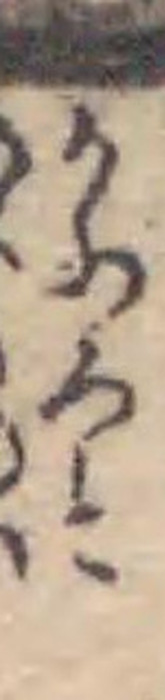かふろと
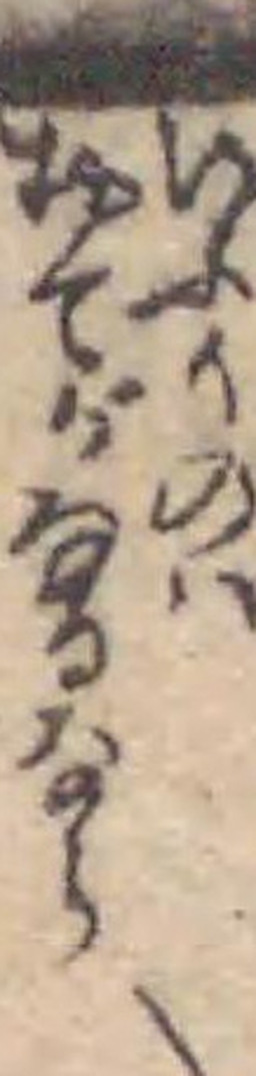おてがなるなら
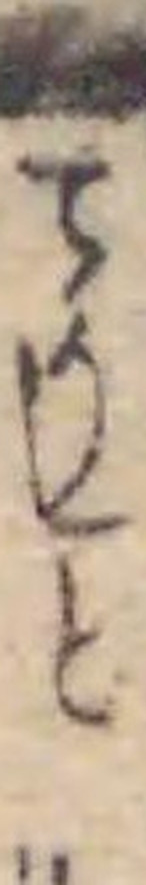てうしと
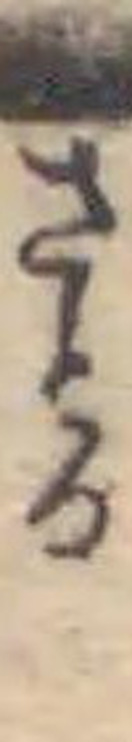さとる
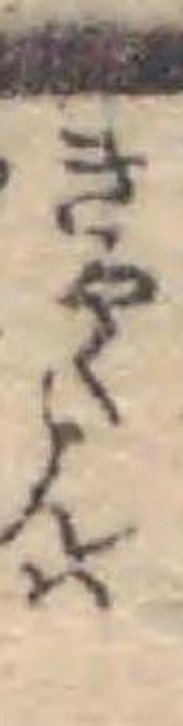きやくしんは
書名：大悲の千六本 : 1巻
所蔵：国立国会図書館 National Diet Library, JAPAN
